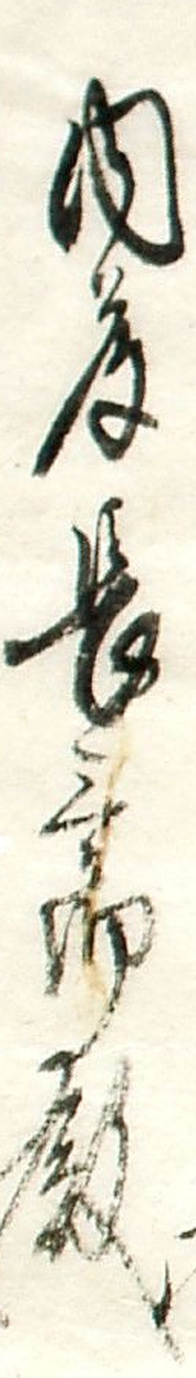内藤長三郎殿
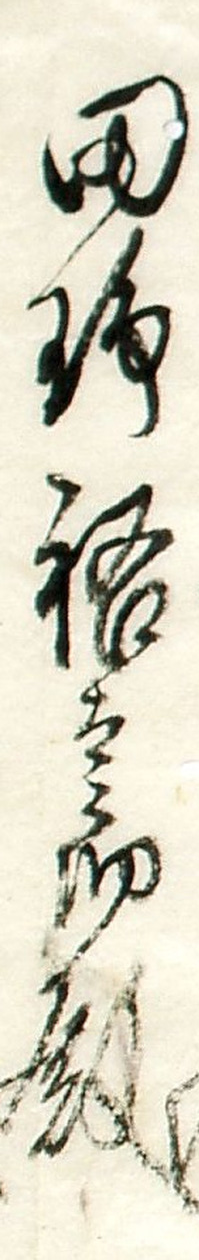田野祐太郎殿
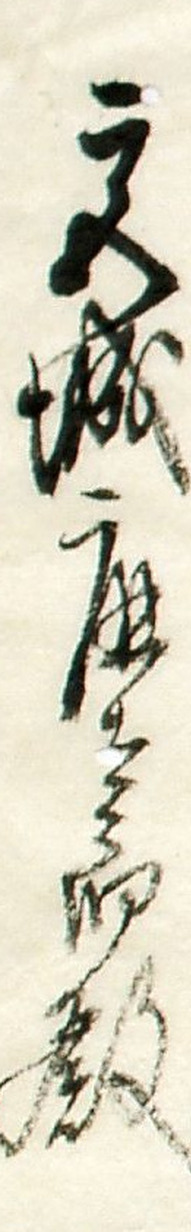宮城麻太郎殿

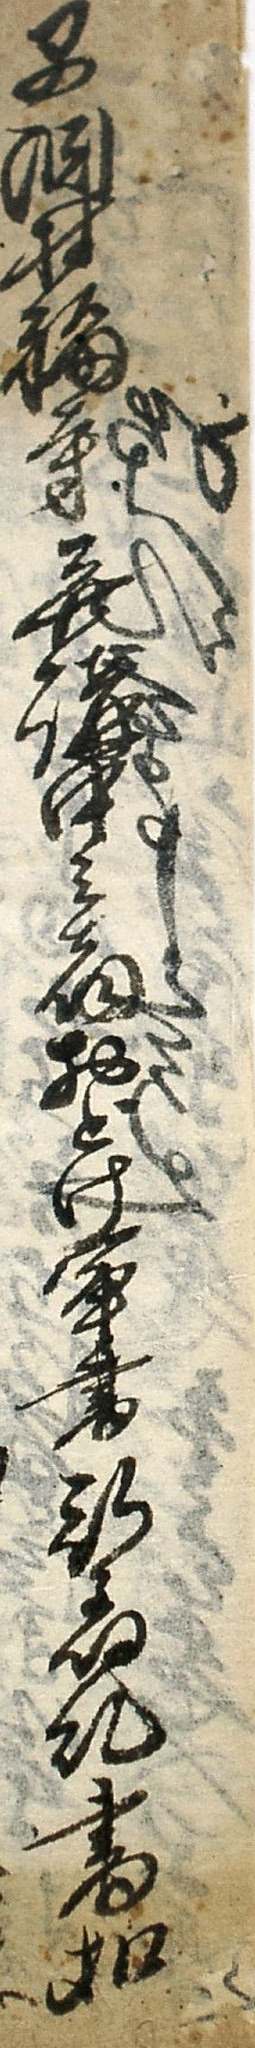早渕村福寺幷講中之者おどけ軍書行着糺書扣
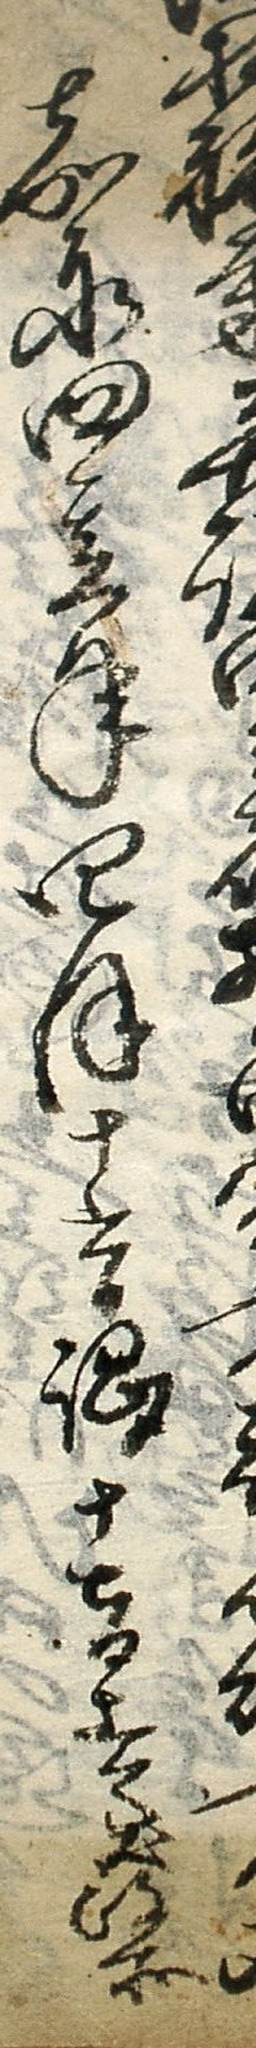嘉永四亥年四月十六日認メ十七日上候方役所

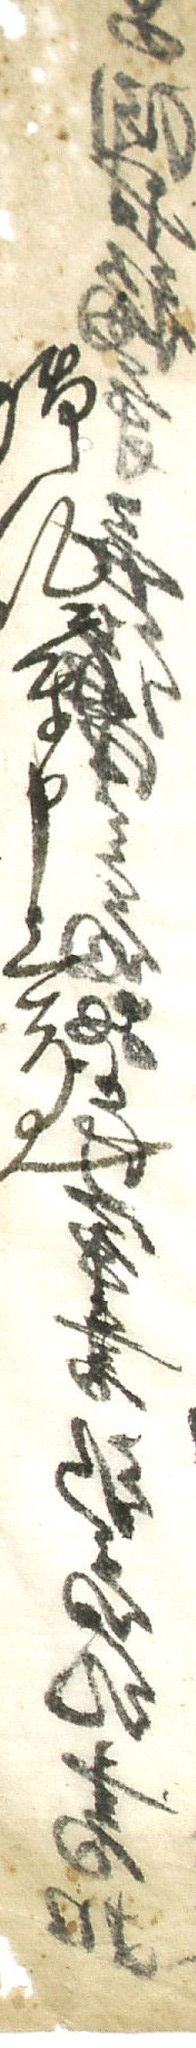御糺ニ付申上覚
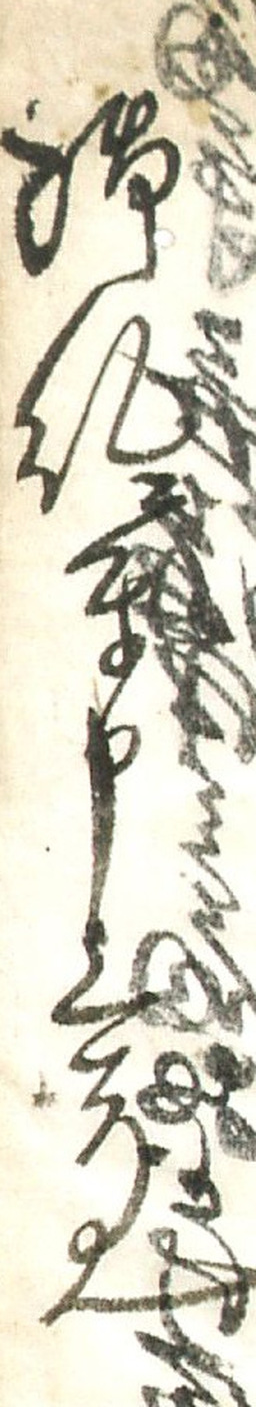御糺ニ付申上覚
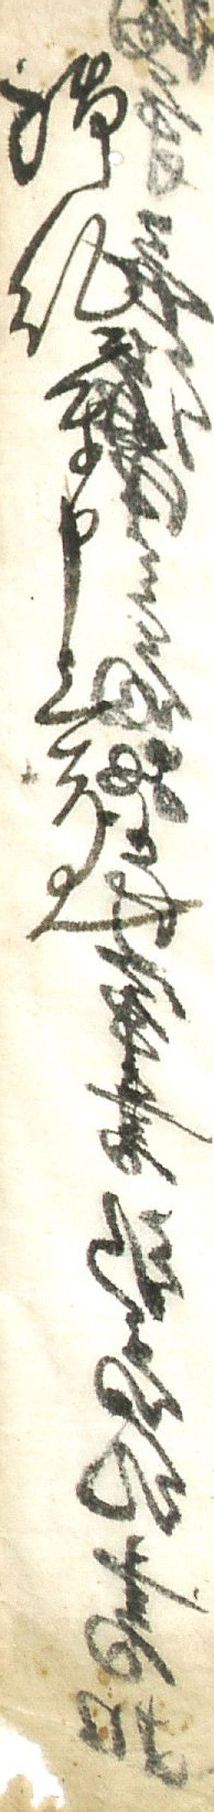御糺ニ付申上覚
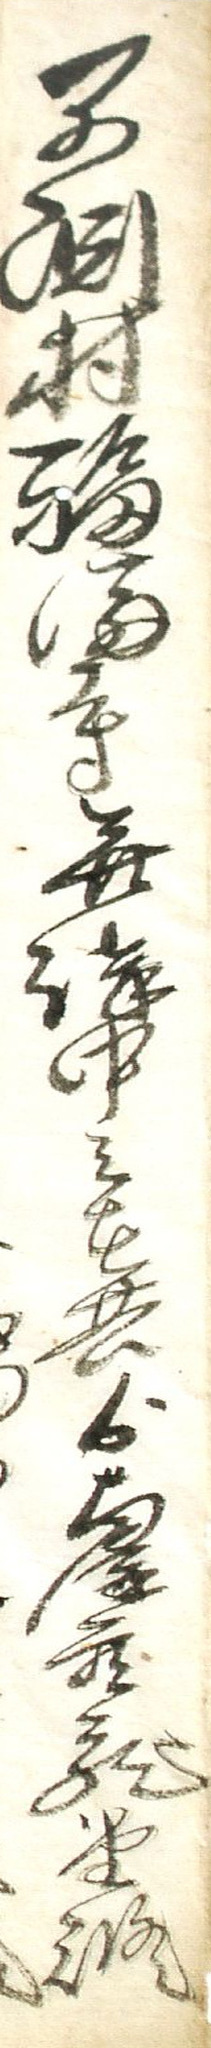早渕村福満寺幷講中之者共ゟ虚空蔵堂修
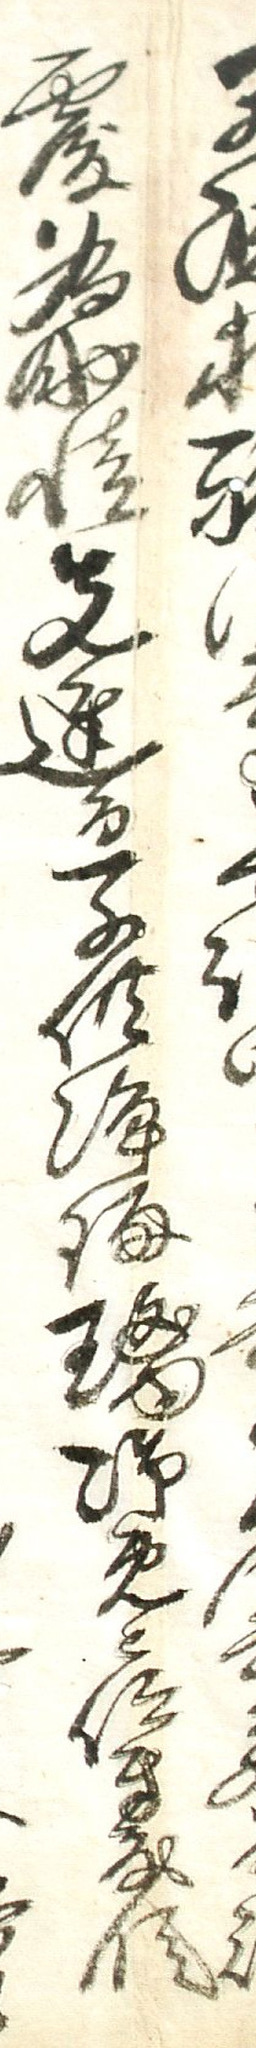覆為助情先達而子供浄瑠璃御免被仰付度段
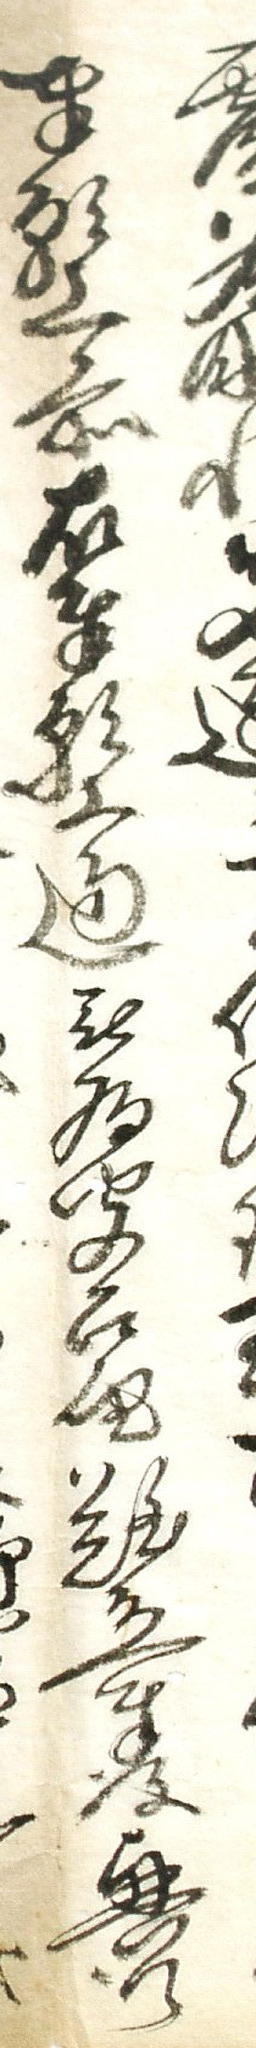奉願上候所右奉願上通被為聞召届難有奉存興行
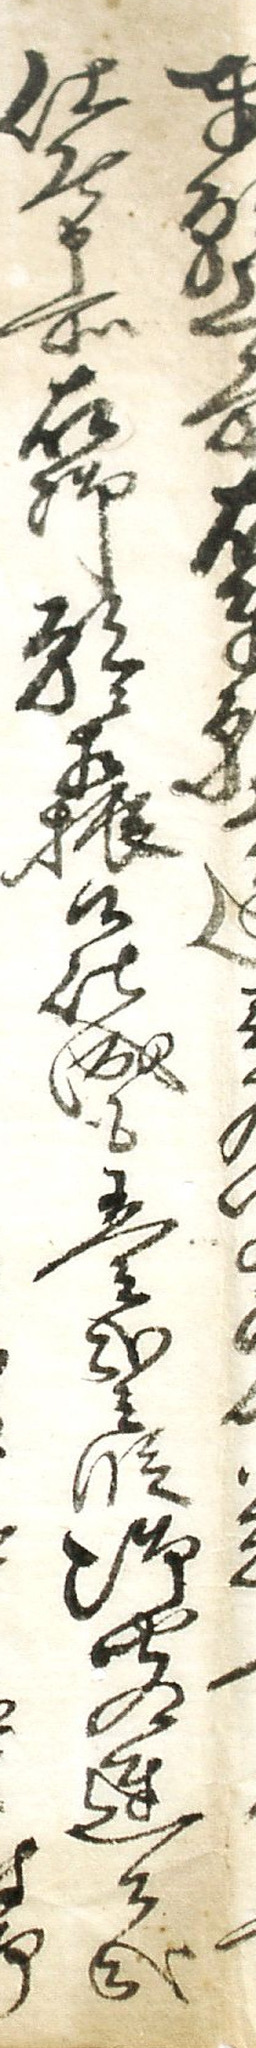仕居申所右御願ニ相振候仕成も有之哉之段御聞達候哉
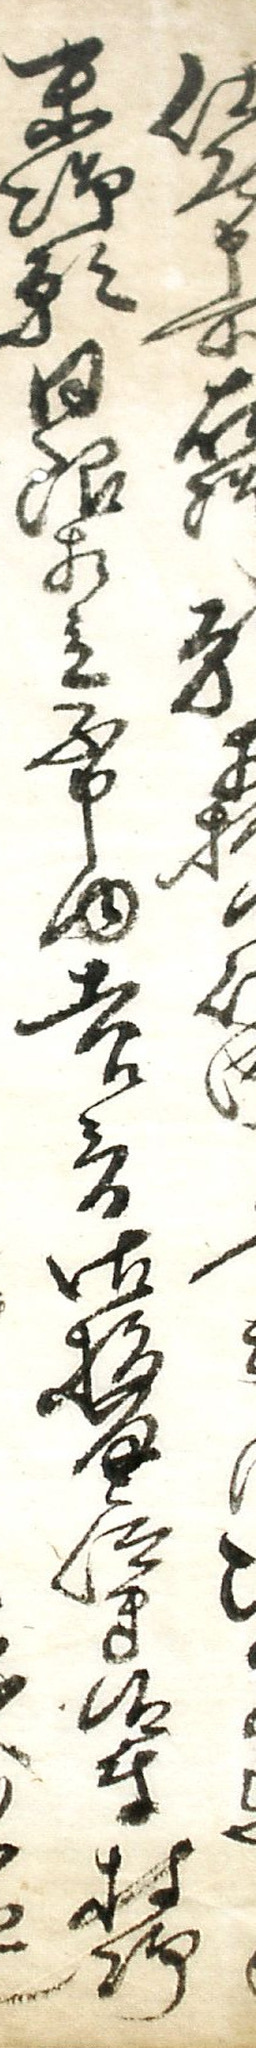未御願日限相立不申内去ル三日御指留被仰付候ニ付村御
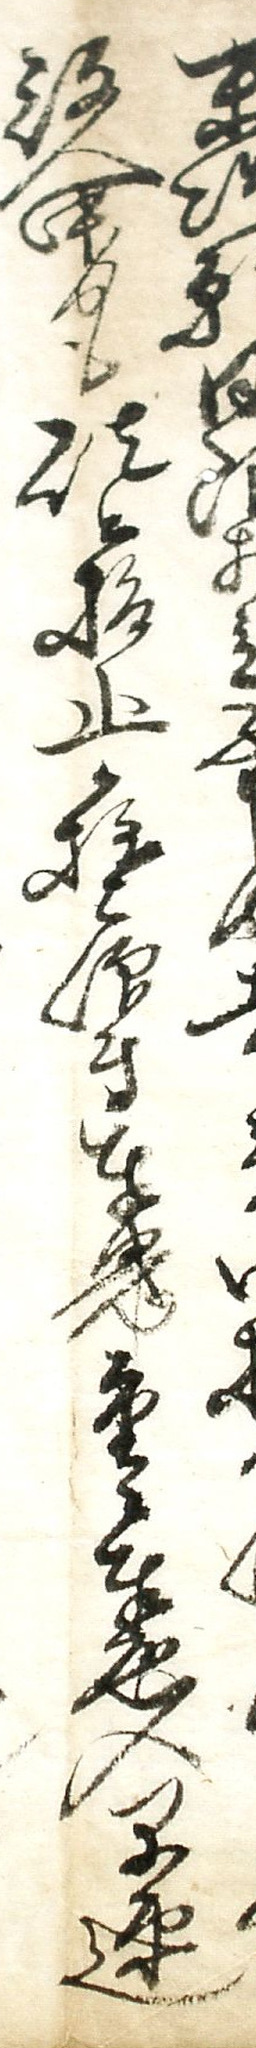役人中ゟも屹と指止候様被仰付奉畏重々奉恐入早速
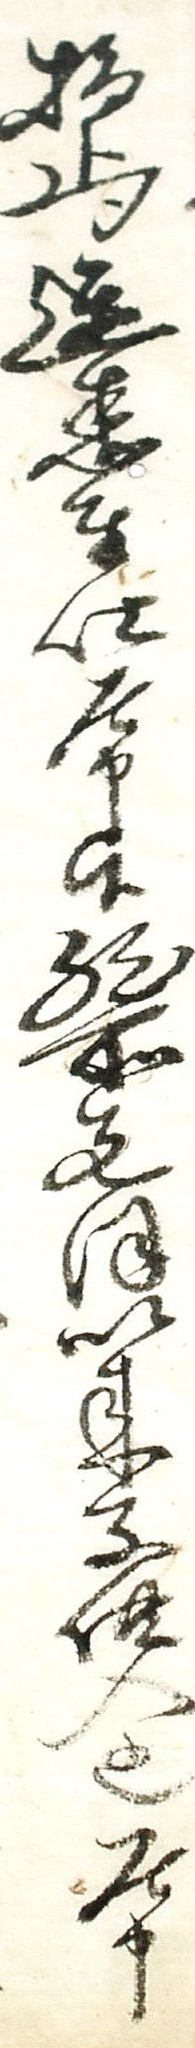指止メ迷惑奉仕居申候然所先月以来子供入込居申
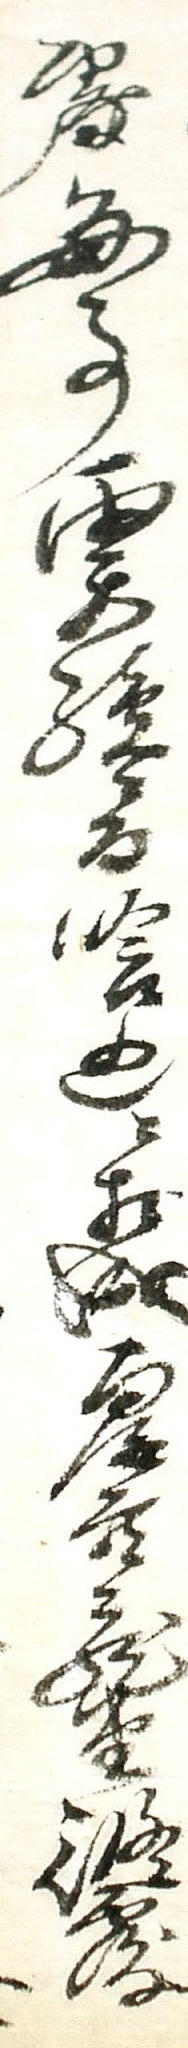處毎事雨天續ニ而喰込ニ相成虚空蔵堂修覆
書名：(早渕村福満寺子ども浄瑠璃願紙面）他
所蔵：鳴門教育大学 Naruto University of Education
